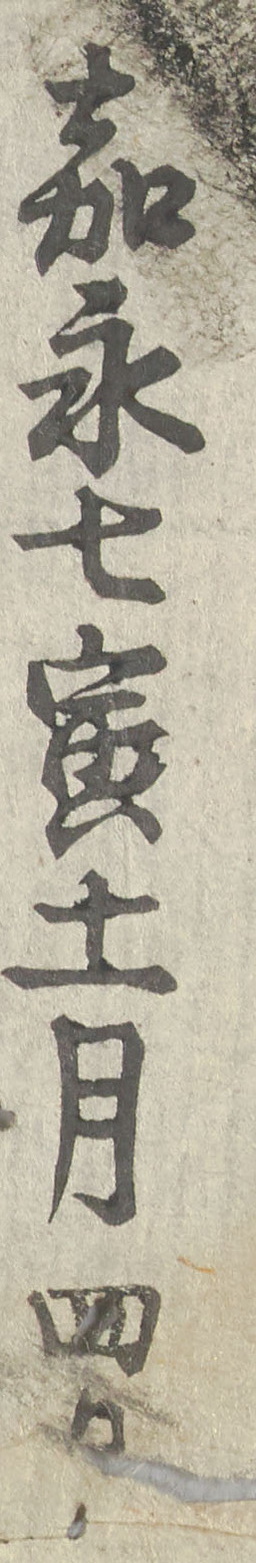嘉永七寅十一月四日
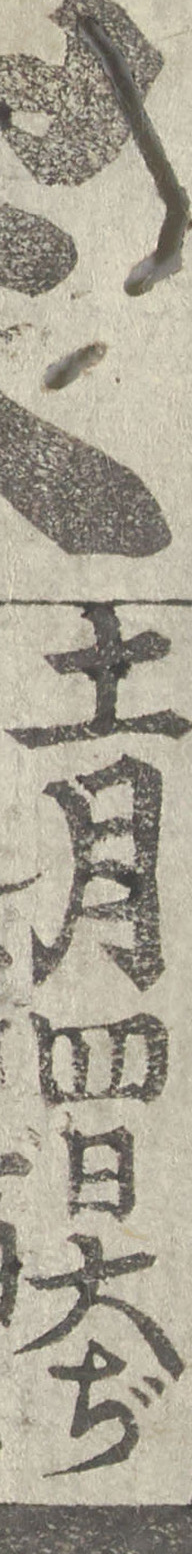十一月四日大ぢ
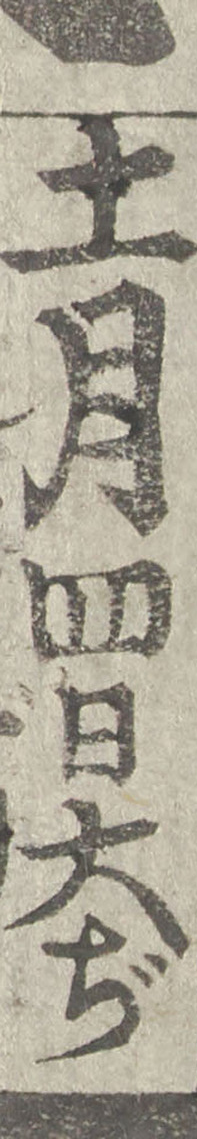十一月四日大ぢ
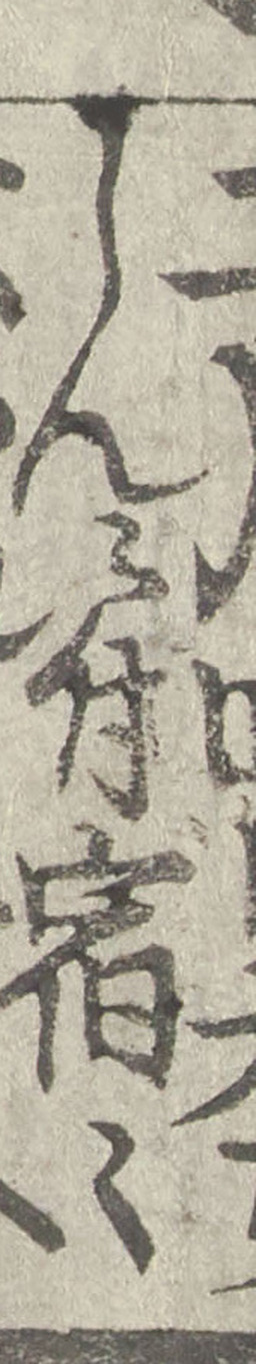しんニ付宿々
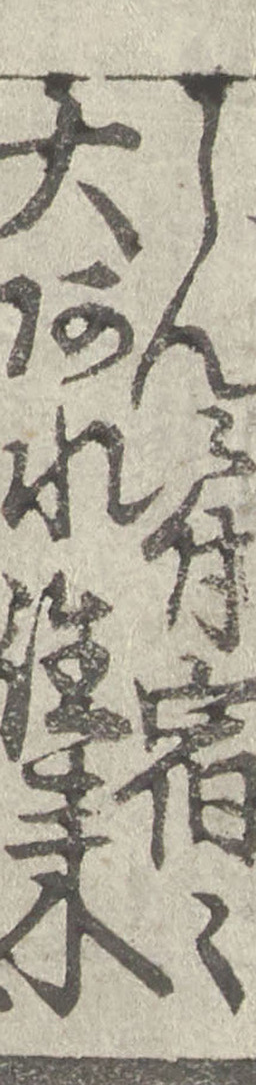大あれ往来
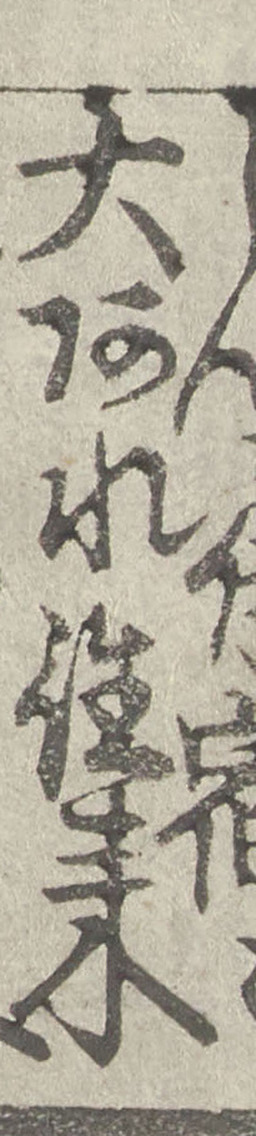大あれ往来
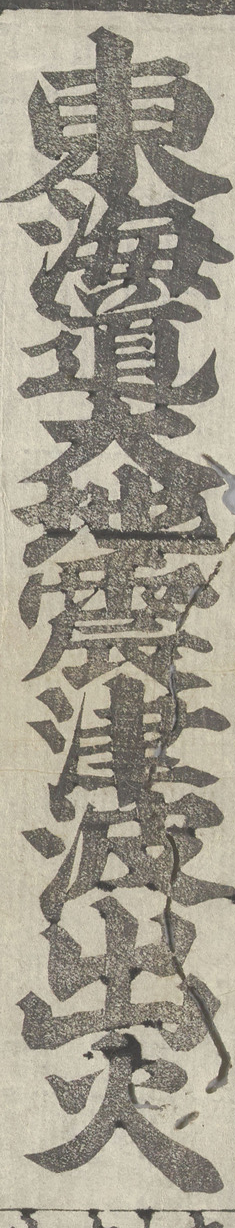東海道大地震津波出火
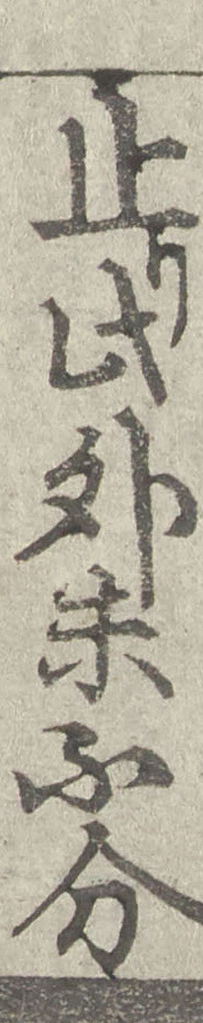止り此外未不分
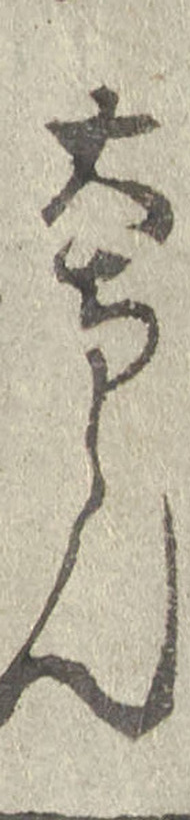大ちしん
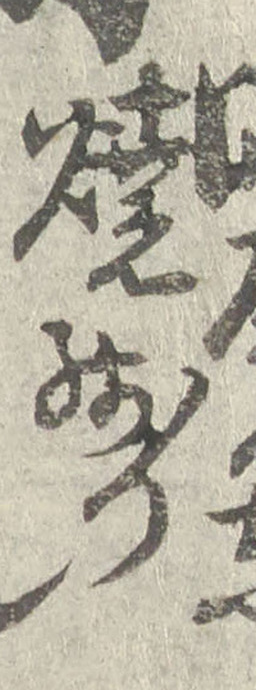焼残り
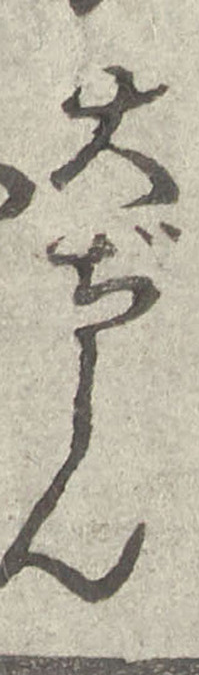大ぢしん
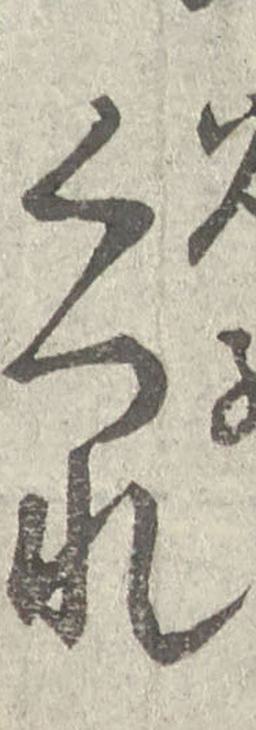くつれ
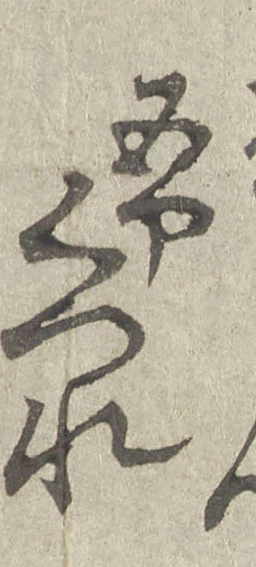くつれ
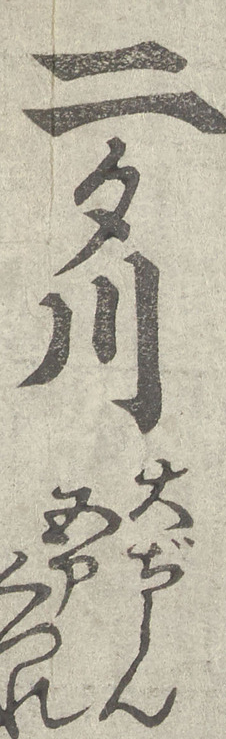二タ川大ぢしん
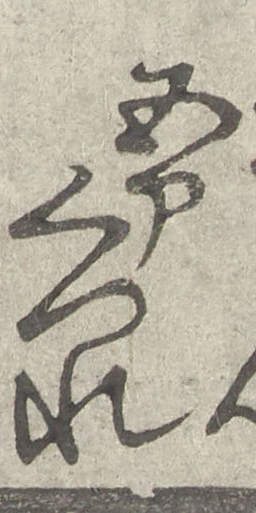くつれ
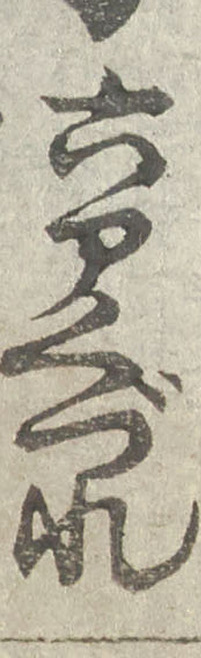六部くつれ
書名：東海道大地震津波出火
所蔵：東京大学総合図書館 General Library in the University of Tokyo, JAPAN
